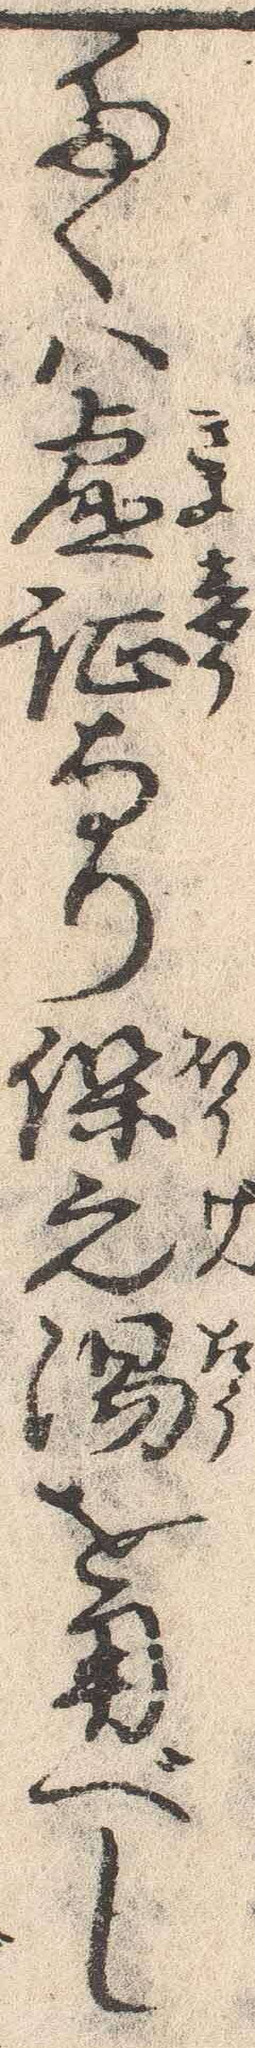多くは虚証なり保元湯を用べし
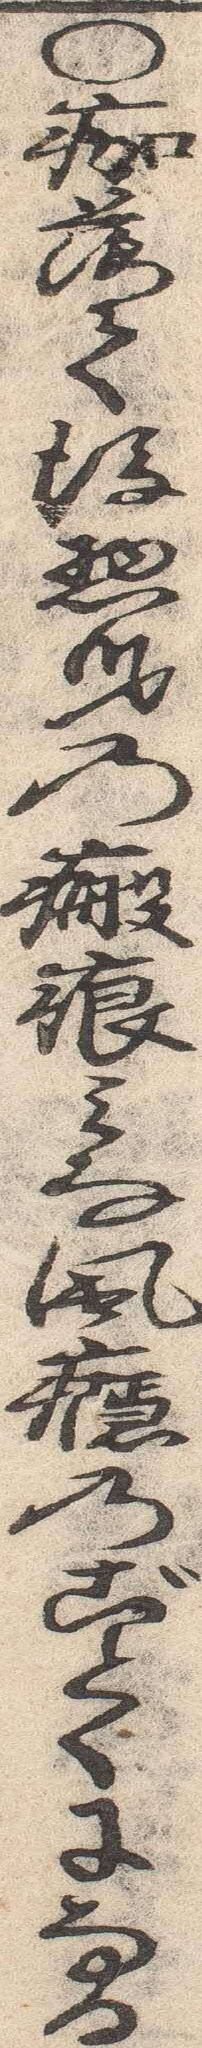○痂落て後総身の瘢痕みな風癮のごとくになる
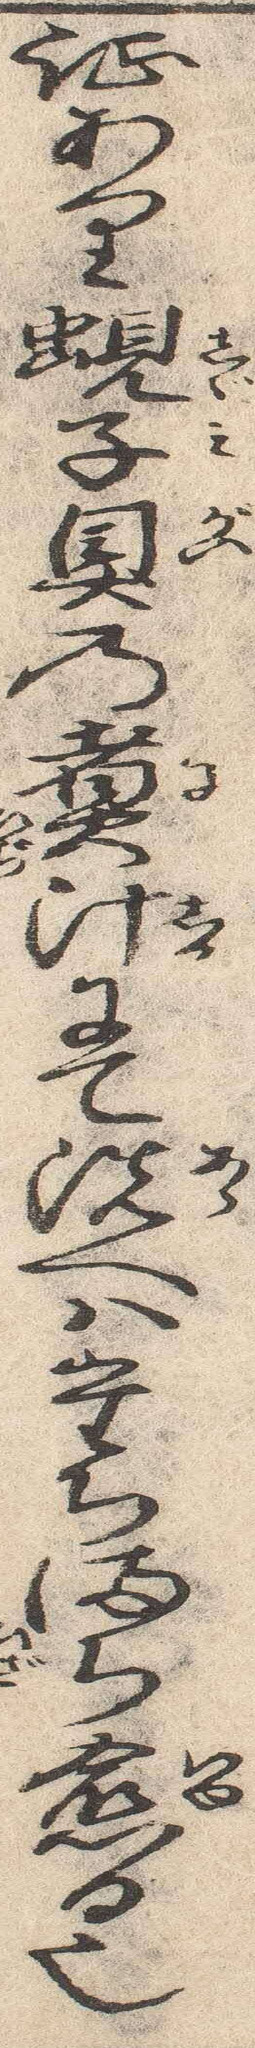証あり蜆子貝の煮汁にて洗へはたちまち愈る也
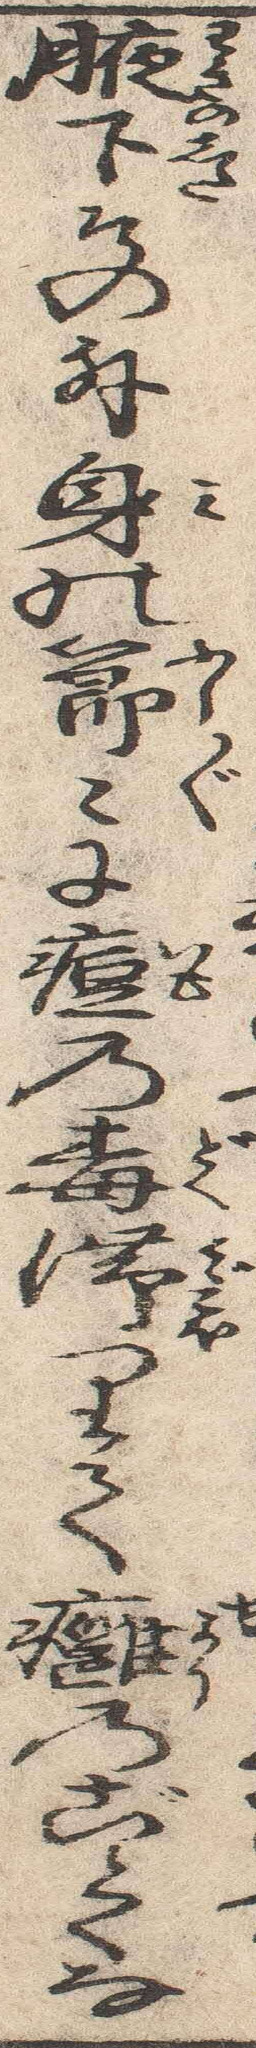腋下その外身の節々に痘の毒滞りて癰のごとくな
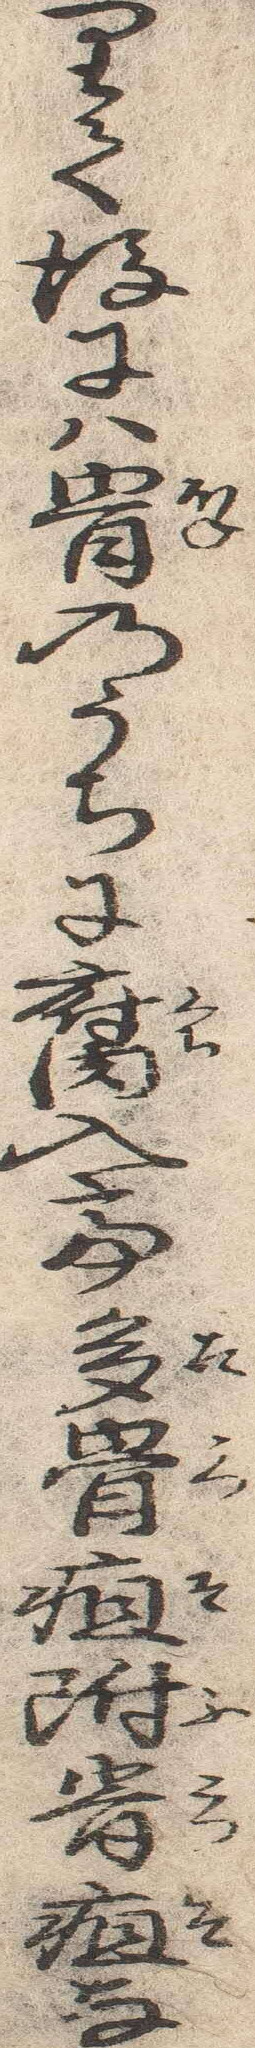りて後には骨のうちに腐入て多骨疽附骨疽な
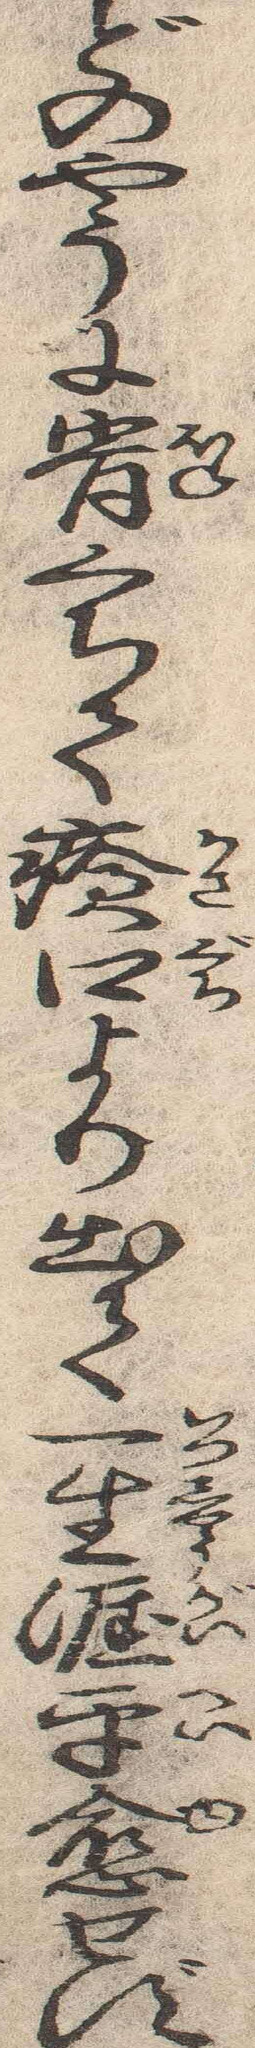どのやうに骨くちて瘡口より出て一生涯平愈せず
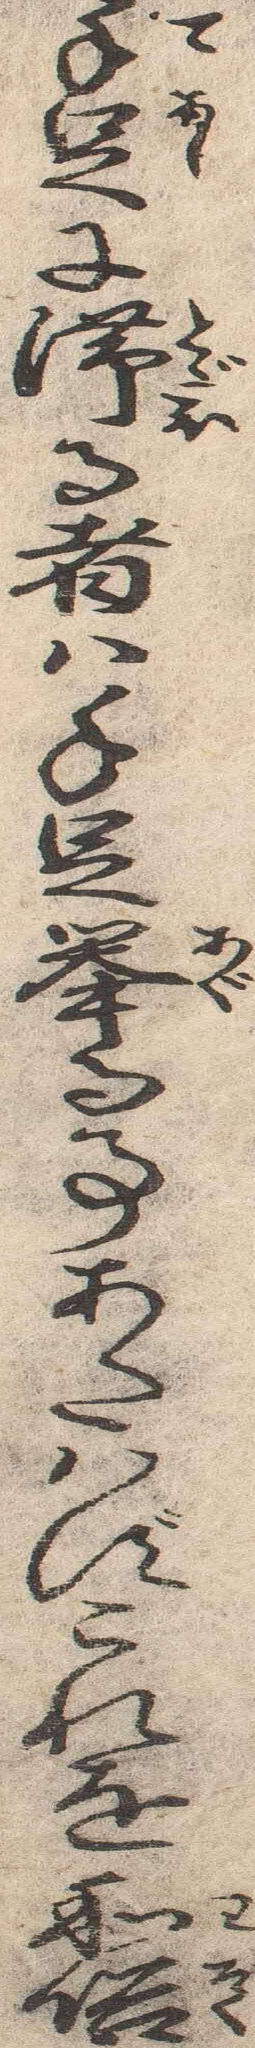手足に滞る者は手足挙る事あたはずこれを和俗
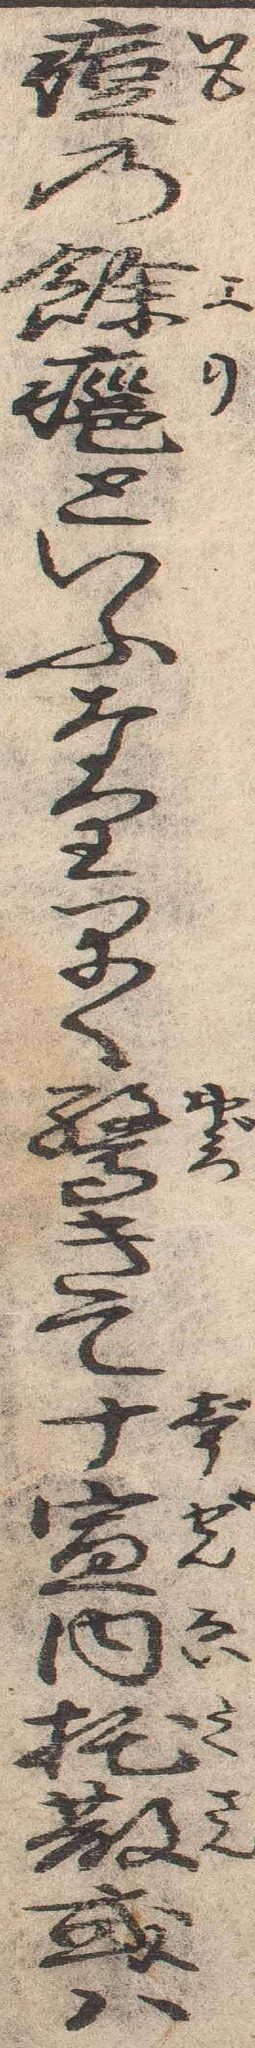痘の余といふなり早く驚きて十宣内托散或は

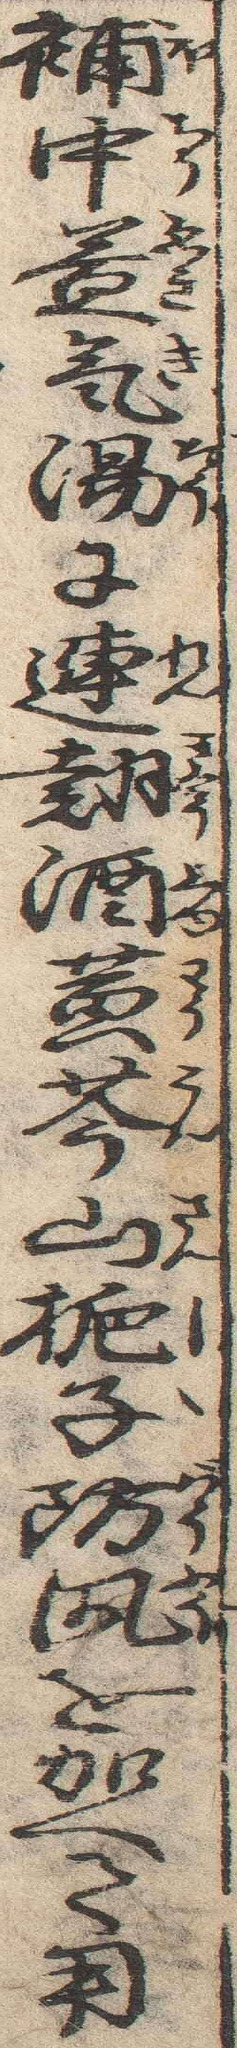補中益気湯に連翹酒黄芩山梔子防風を加へて用
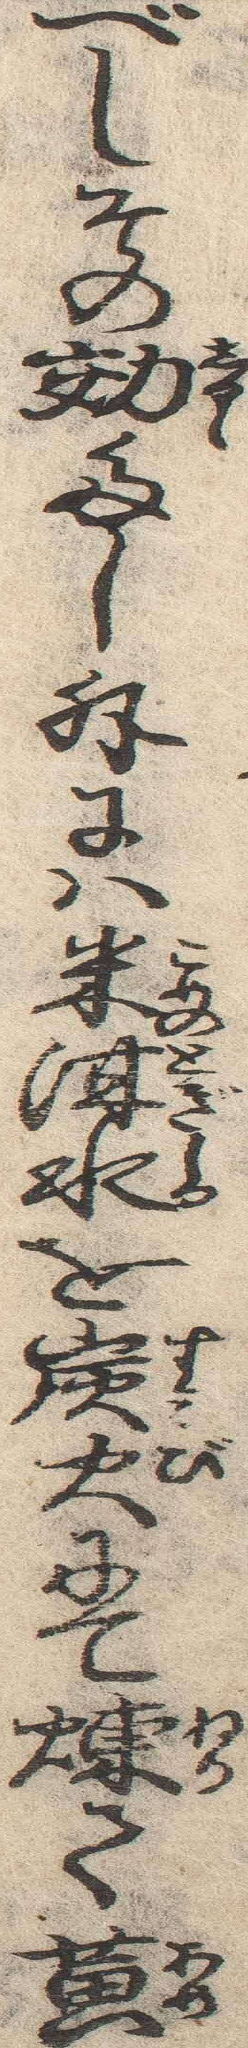べしその効多し外には米泔水を炭火にて煉て黄
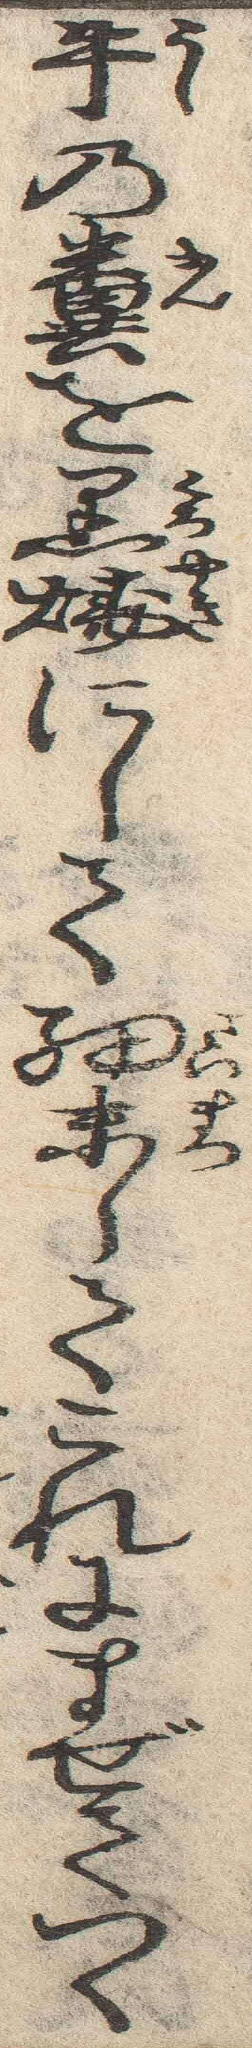牛の糞を黒焼にして細末してこれにまぜてつく
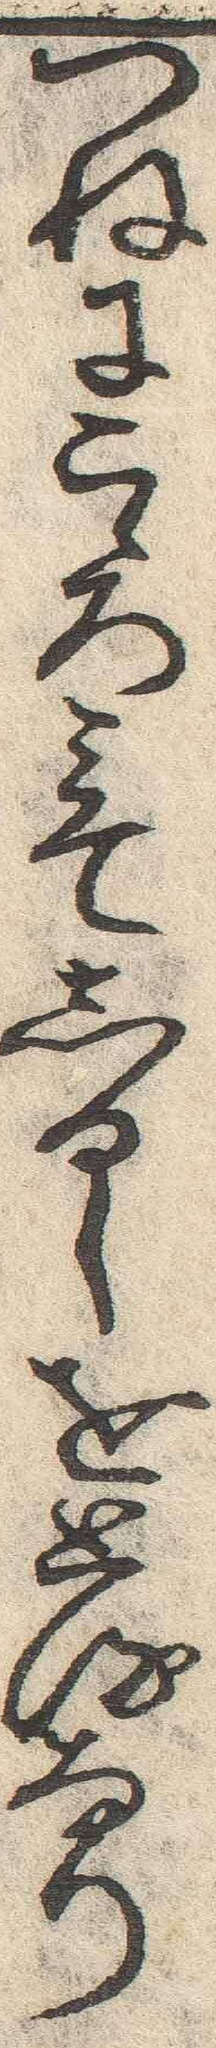つねにこゝろみてしるしをとるなり
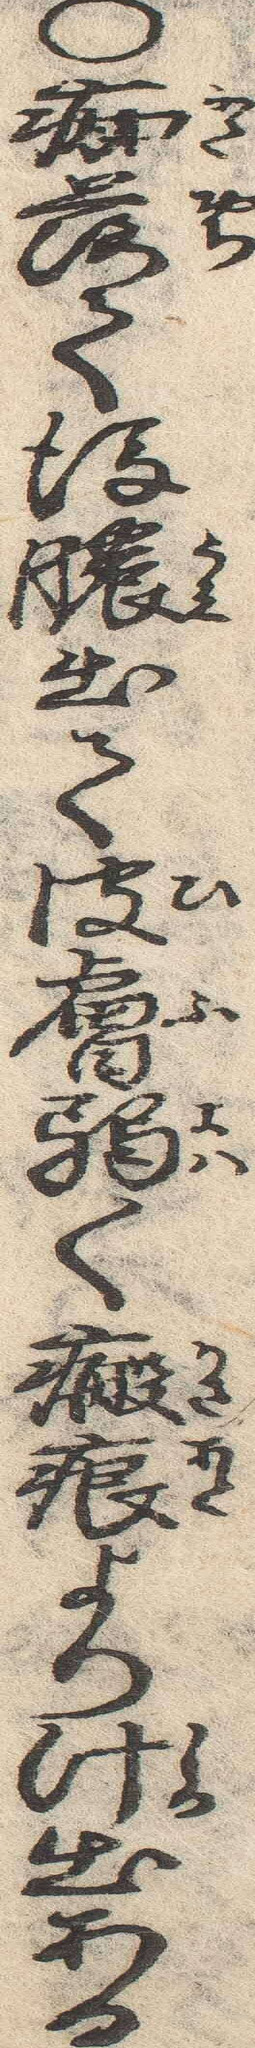○痂落て後膿出て皮膚弱く瘢痕より汁出ある
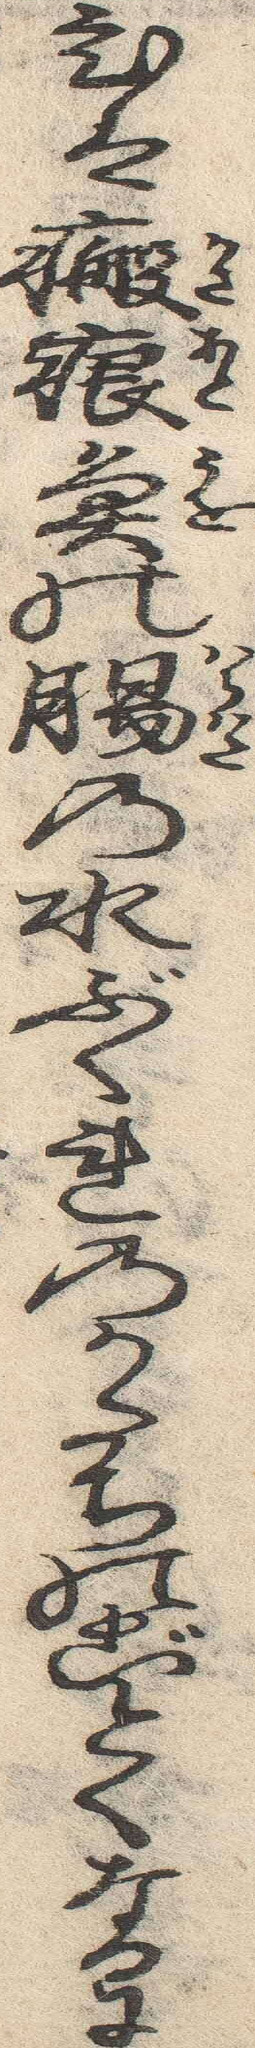ひは瘢痕魚の腸の水ぶくれのかたちのごとくなるに
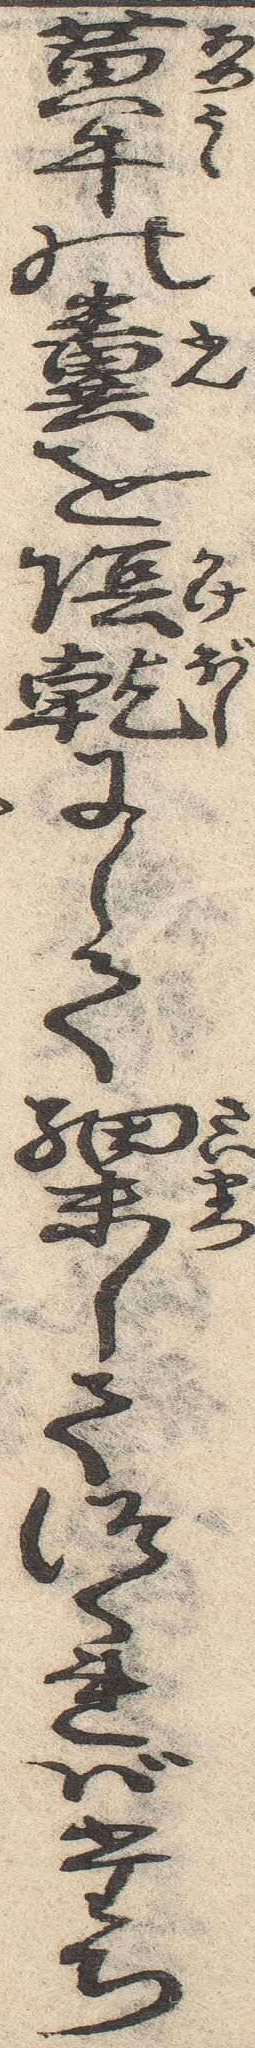黄牛の糞を陰乾にして細末してつくればたち
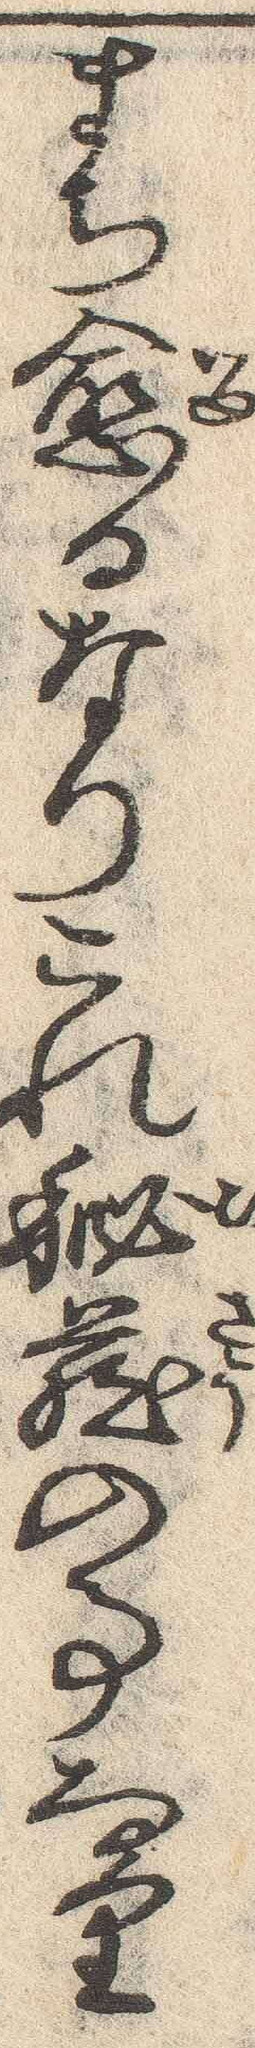まち愈るなりこれ秘蔵の事なり
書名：小児必用養育草
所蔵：東京学芸大学附属図書館 国文学研究資料館
